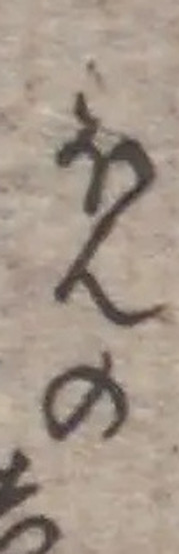ほんの

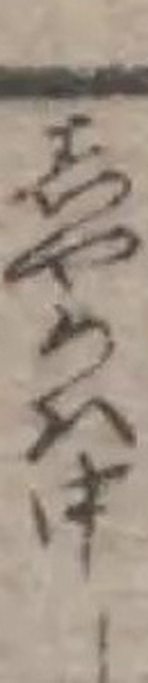しやかは中
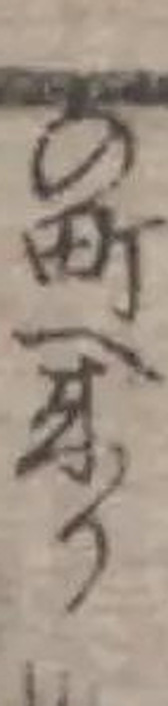の町へ来り
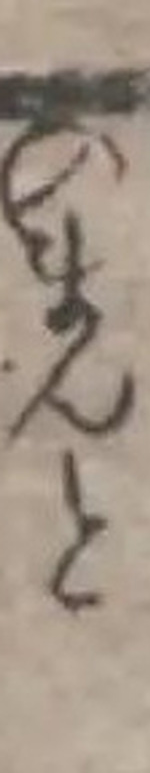のまんと
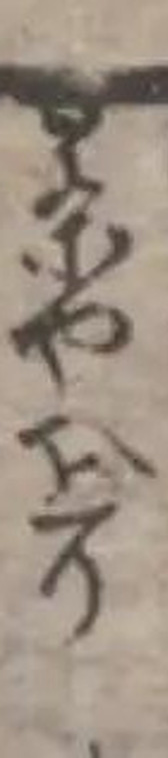茶やへ上り
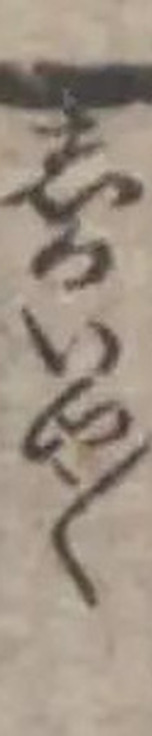しかいや〳〵
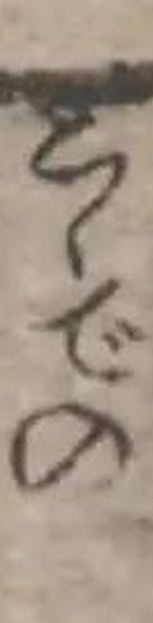こゝでの
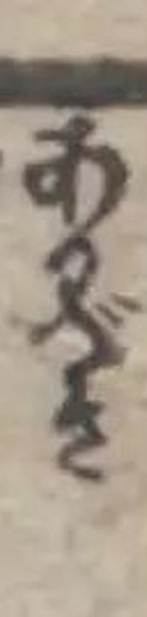あるべき
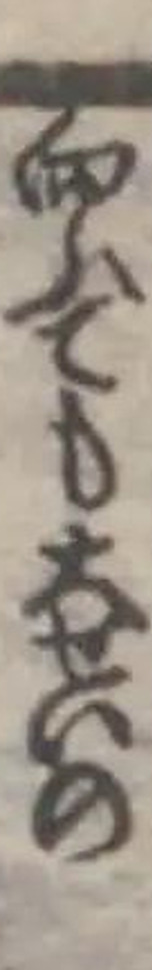向ふても大せいの
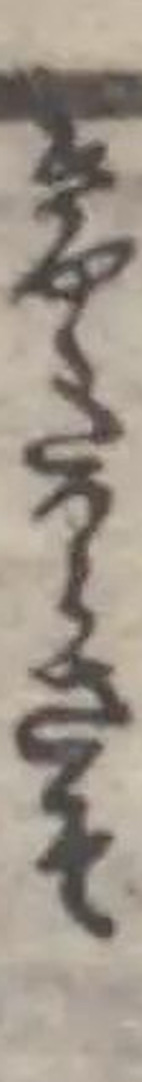きやくたからさそ
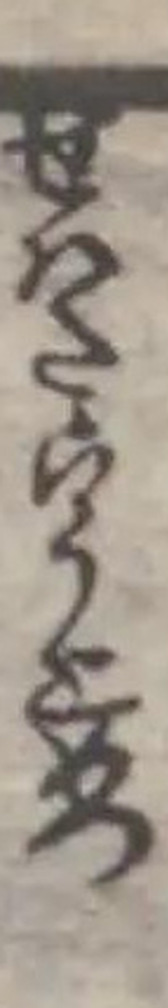せはたらうとめつ
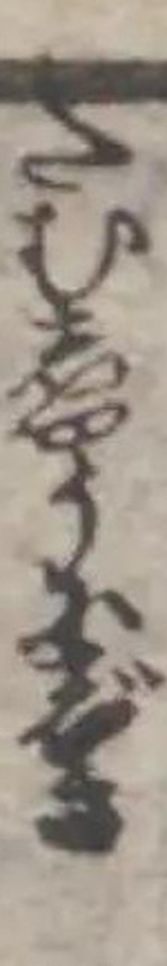たむしやうにじき
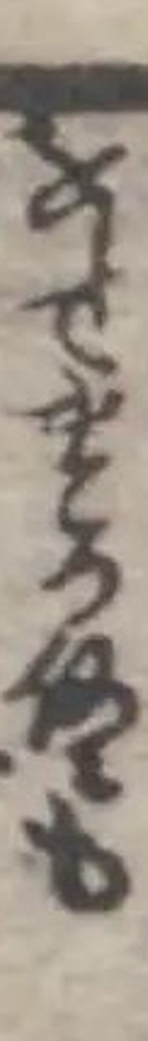をしてまり何にも
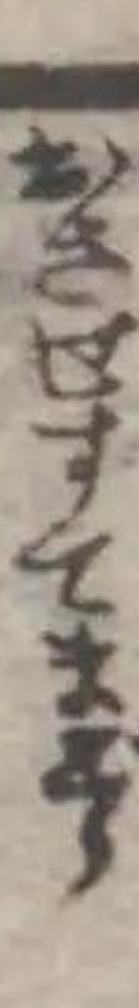おさせすてまどら
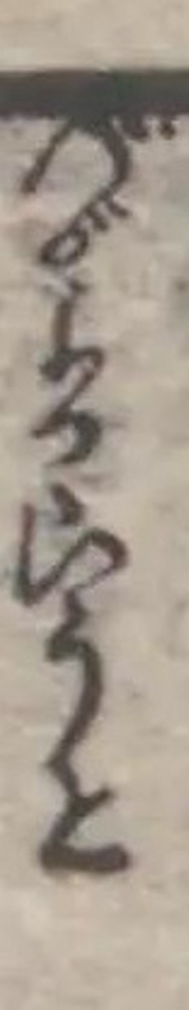づゟよからうと
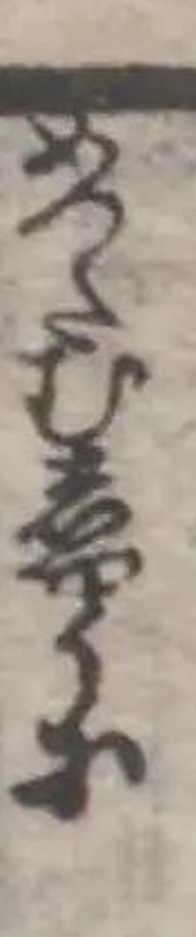めつたむしやうに
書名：早出来 3巻
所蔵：国立国会図書館 National Diet Library, JAPAN
